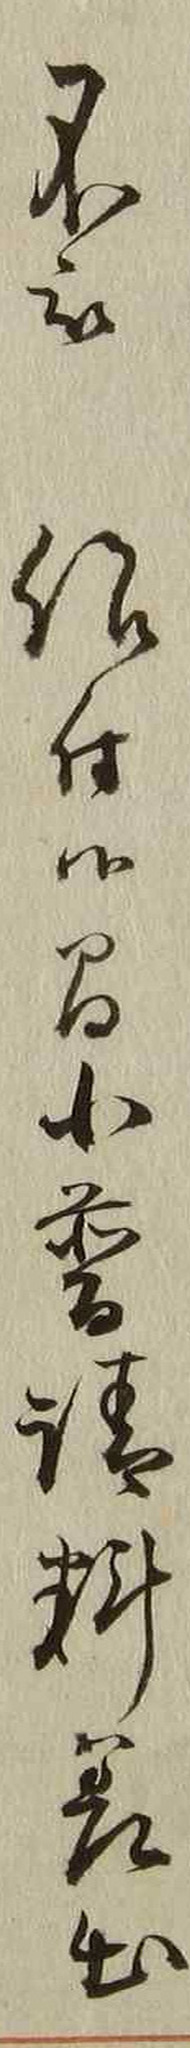不被仰付候間小普請料差出
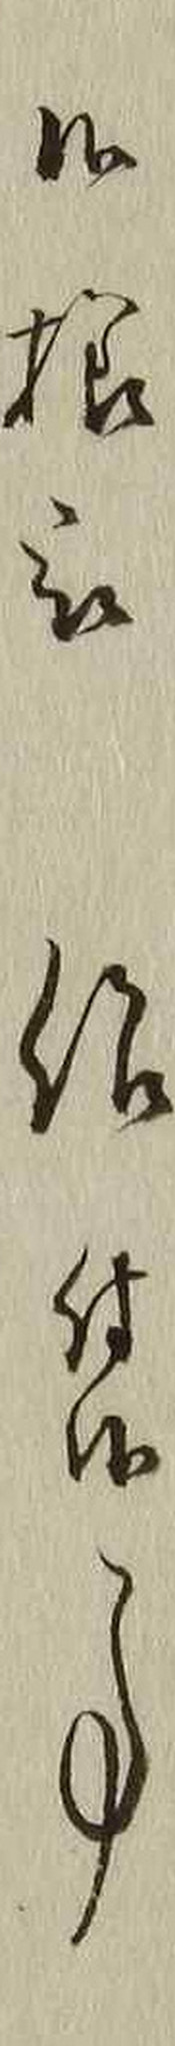候様被仰付候事
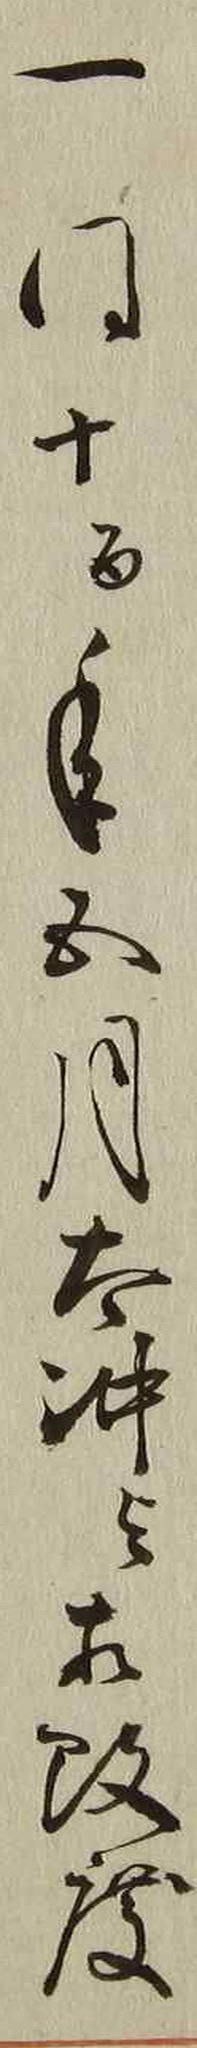一同十酉年五月太沖と相改度
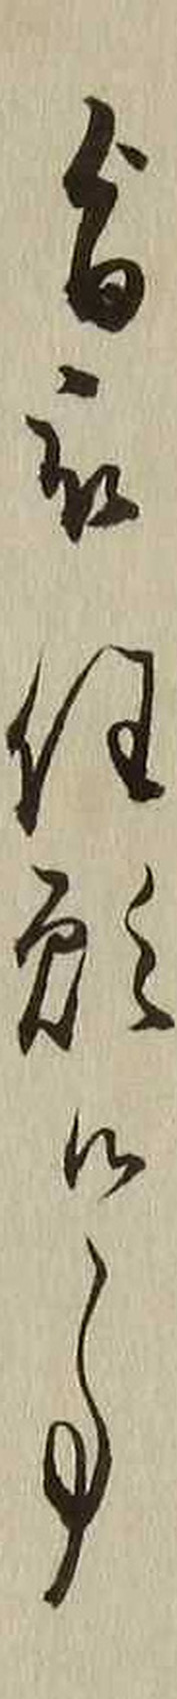旨被任願候事
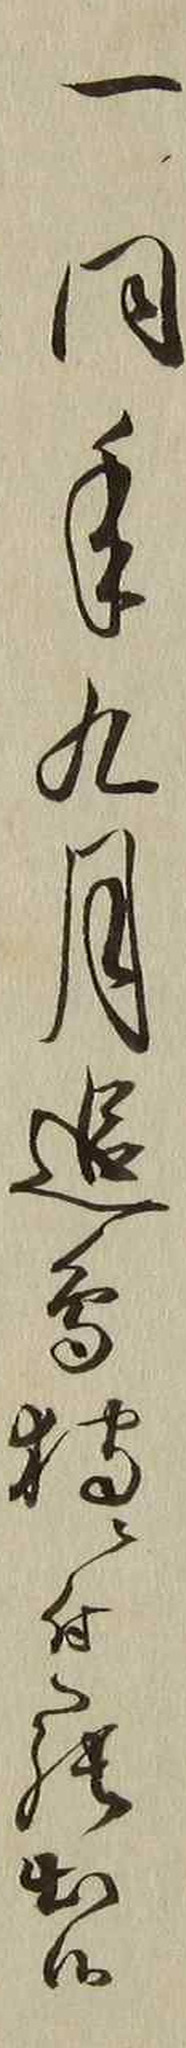一同年九月追鳥狩ニ付罷出候
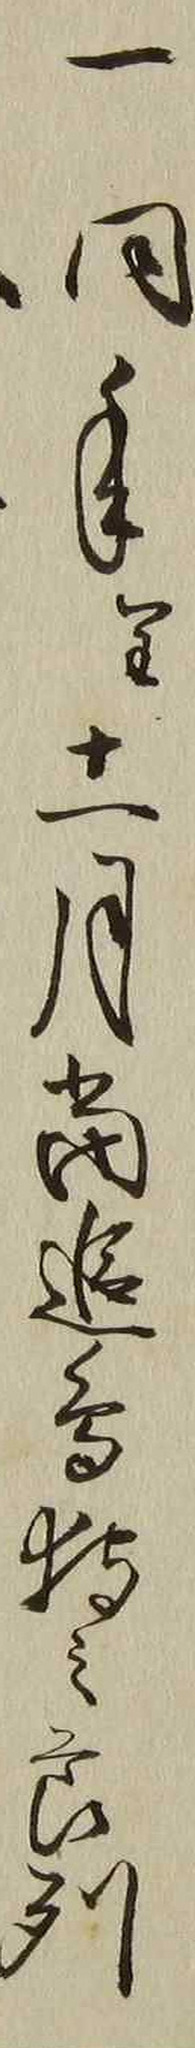一同年閏十一月当追鳥狩之節列
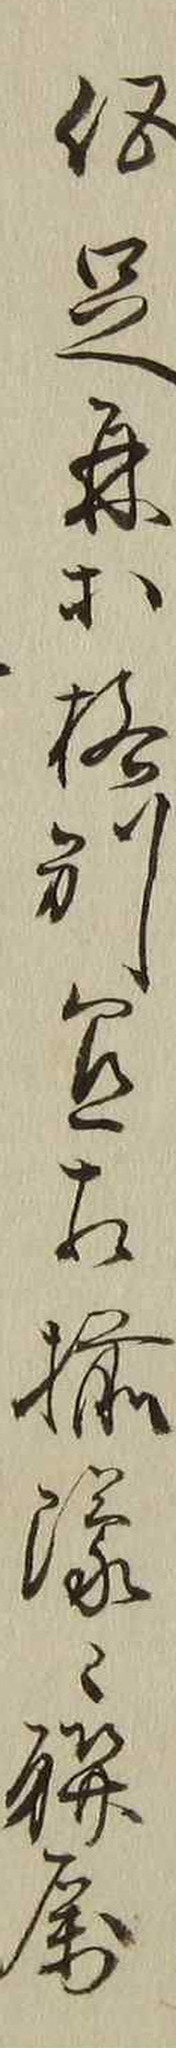伍足並等格別宜相揃隊々聯属
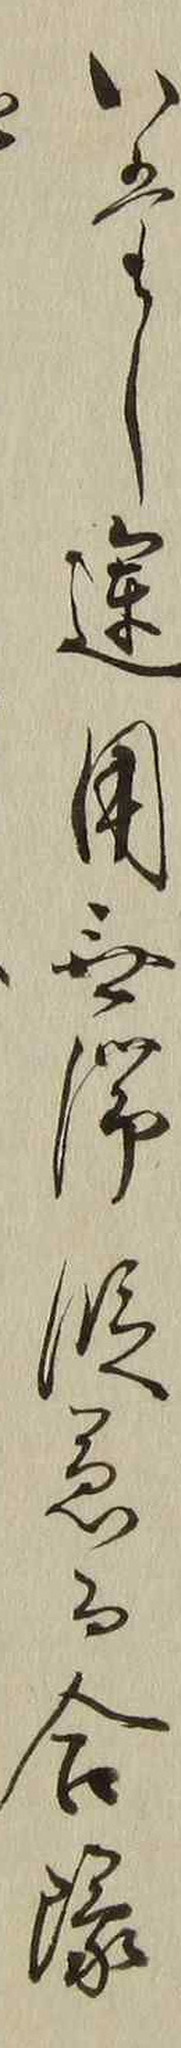いたし運用無滞段兼而合隊
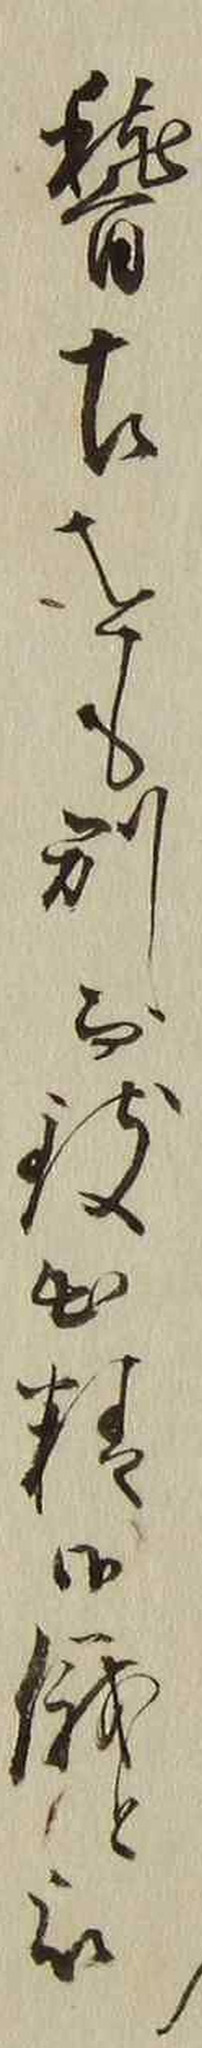稽古をも別而致出精候儀と被
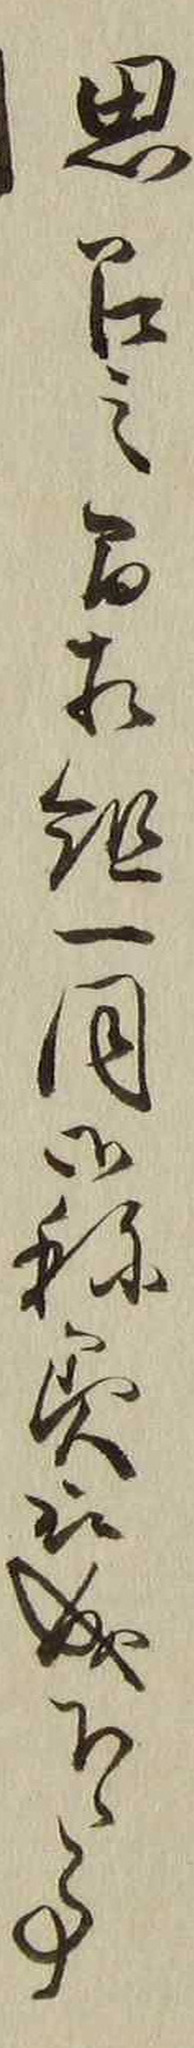思召之旨相組一同御称美被成下候事
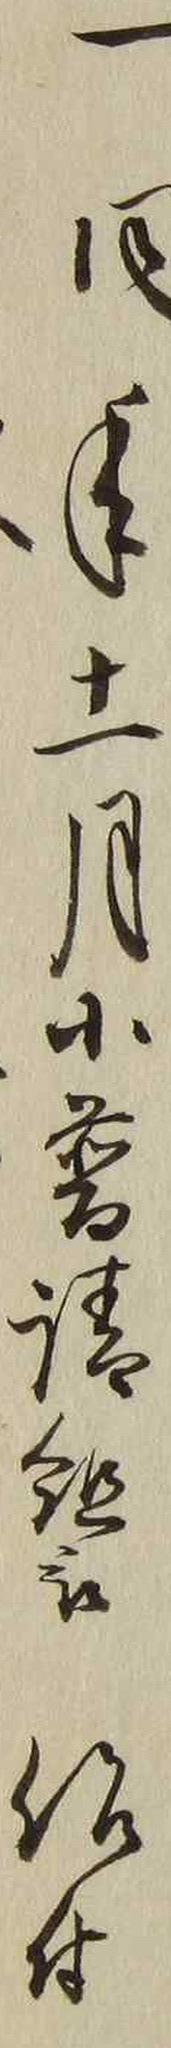一同年十一月小普請組被仰付
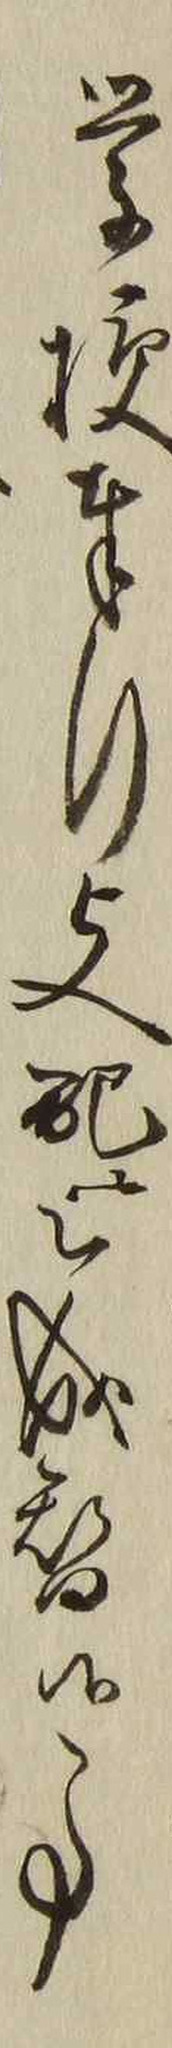学校奉行支配此成替候事
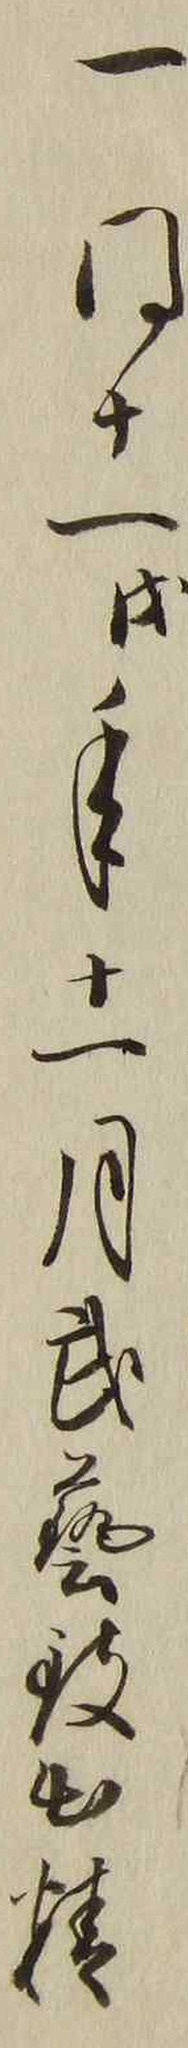一同十一戌年十一月武芸致出精

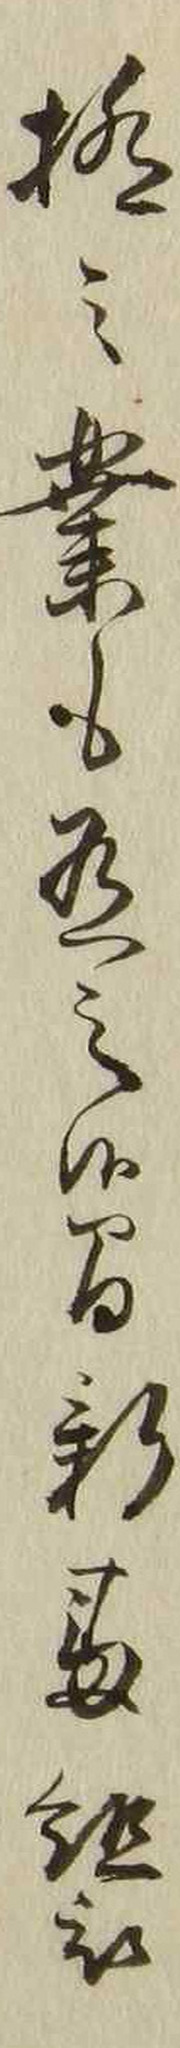極之業も有之候間新番組被
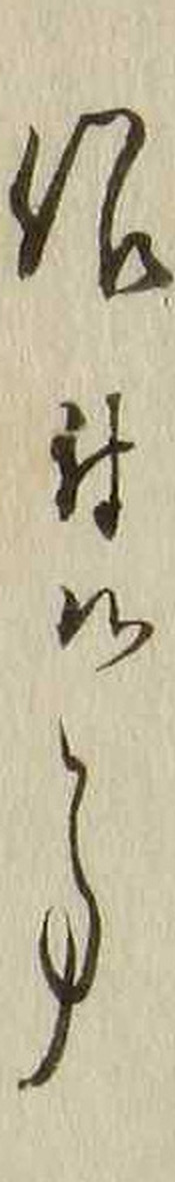仰付候事
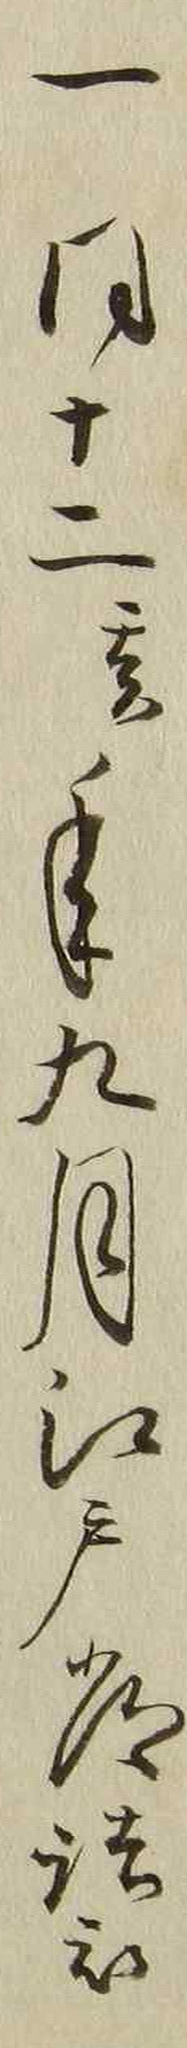一同十二亥年九月江戸常詰被
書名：諸士系譜　巻之57　ほ之部4
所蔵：会津若松市立会津図書館
